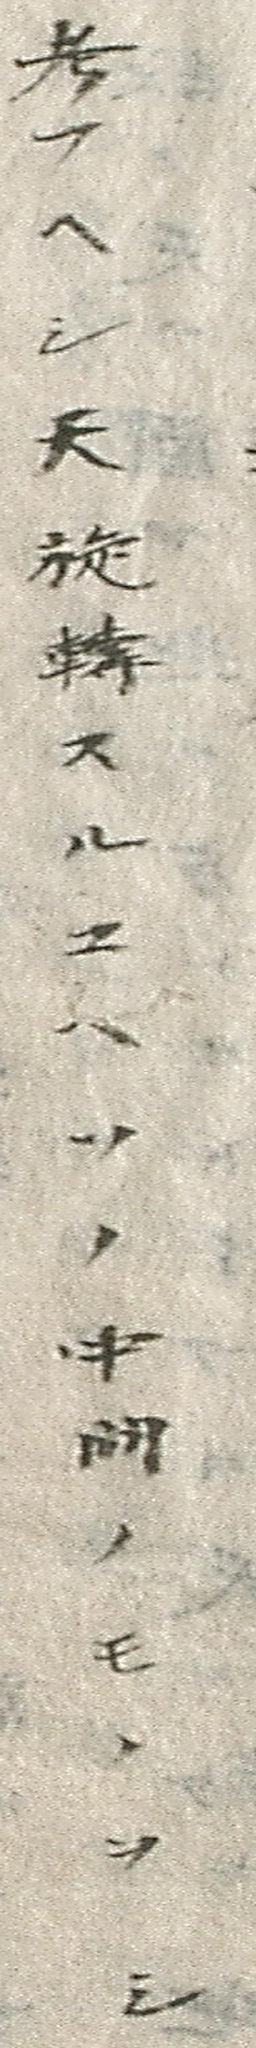考フヘシ天施転スルユヘソノ中間ノモノヲシ
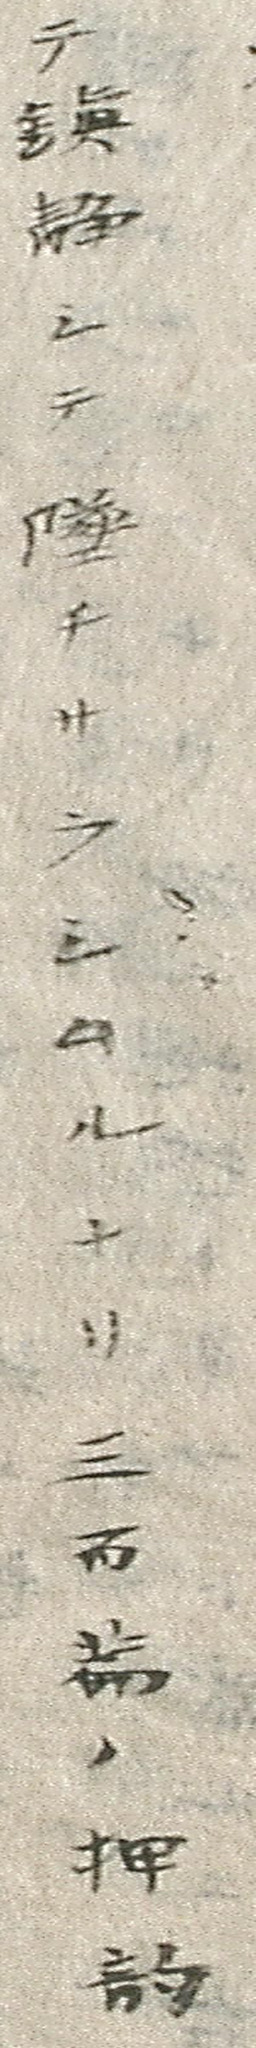テ鎮静シテ墜チサラシケルナリ三百篇ノ押詢
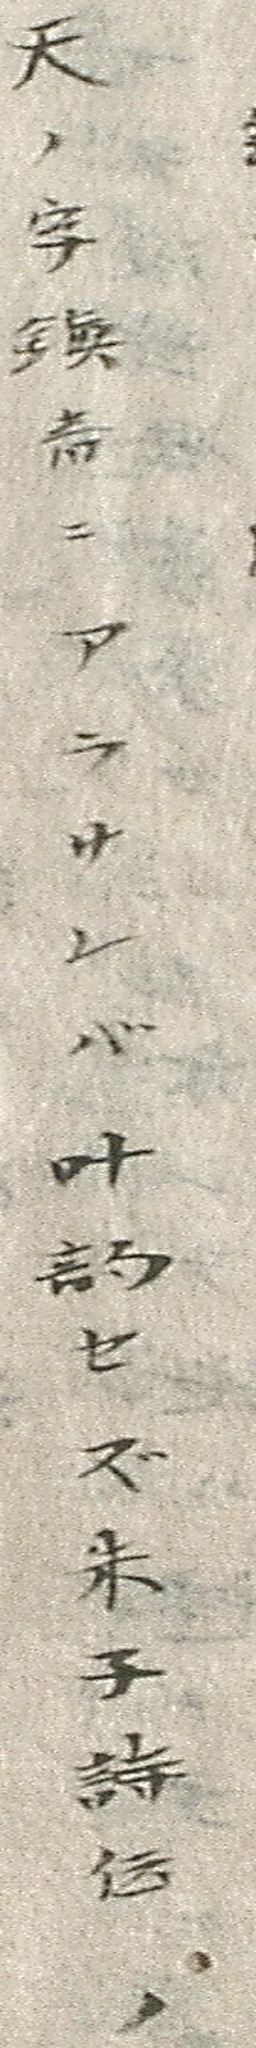天ノ宇鎮者ニアラサレバ叶詢セッズ朱子詩伝ノ
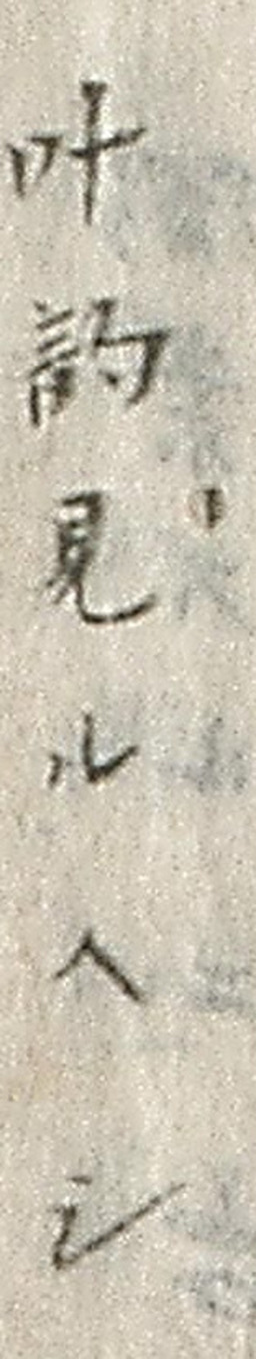叶詢見ルヘシ
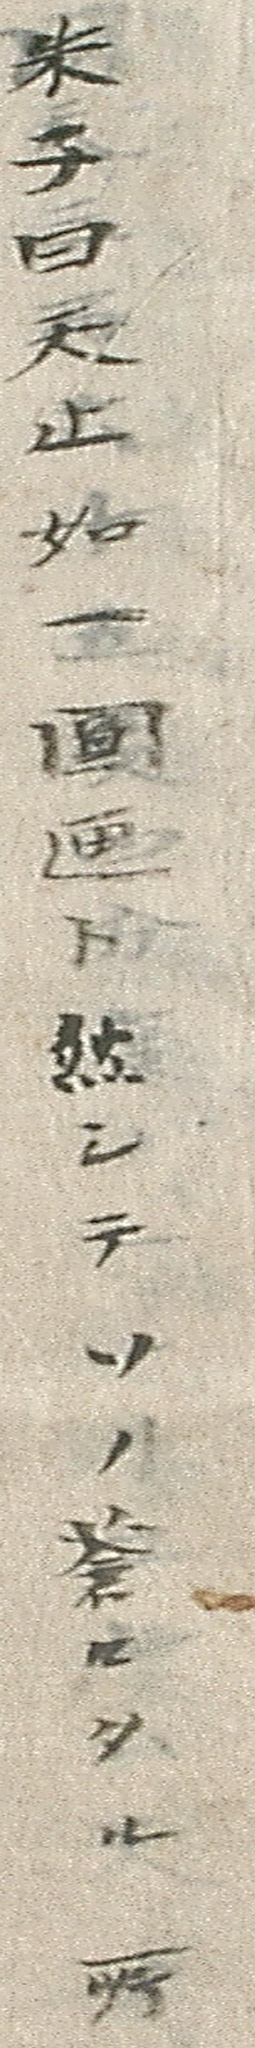朱子曰天止如一円匣ト然シテソノ蒼々タル所
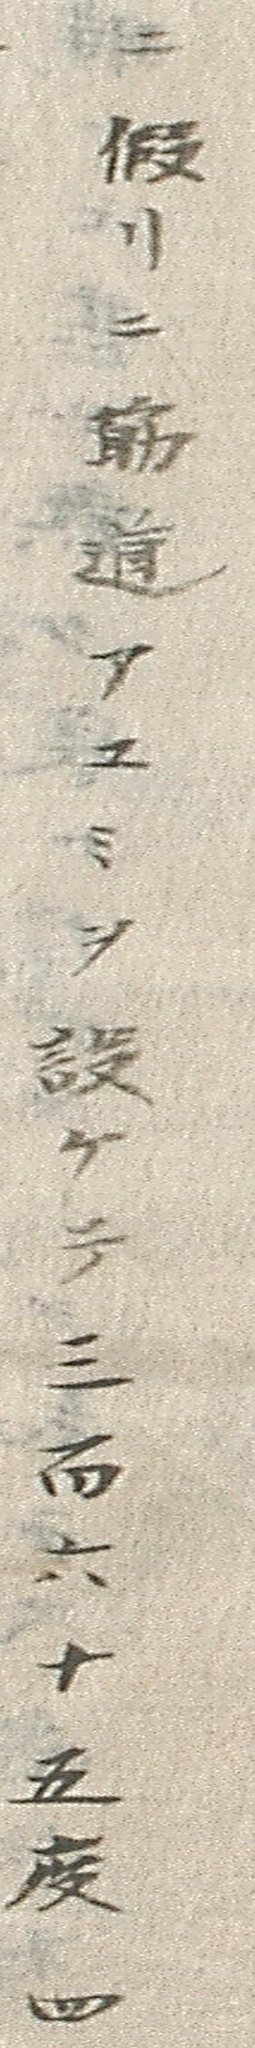ニ仮ニ筋道アユミヲ設ケテ三百六十五度四
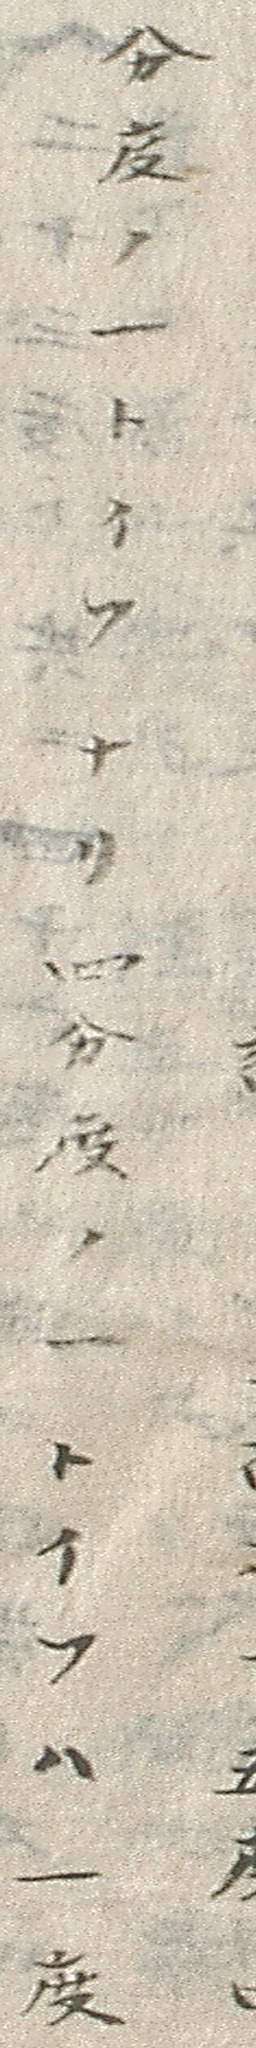分度ノ一トイフナリ四分度ノ一トイフハ一度
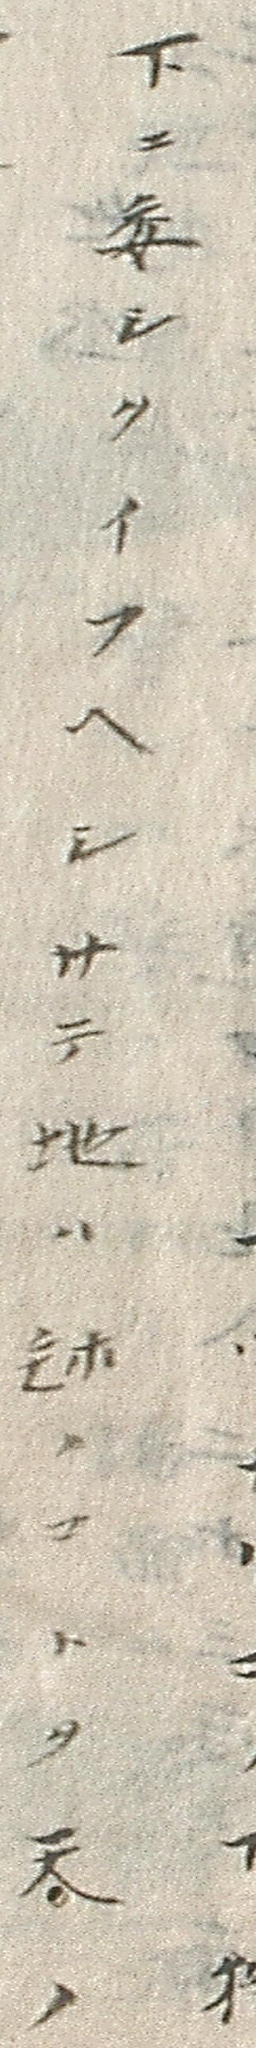下ニ委シクイフヘシサテ地ハ毬ノコトク天ノ
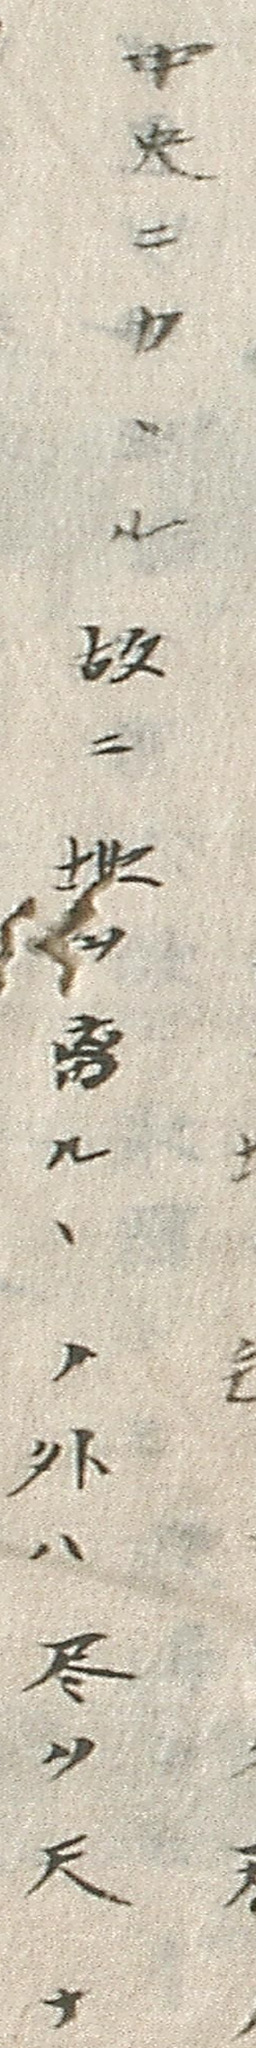中央ニカヽル故ニ地ヲ离ルヽノ外ハ尽ソ天ナ
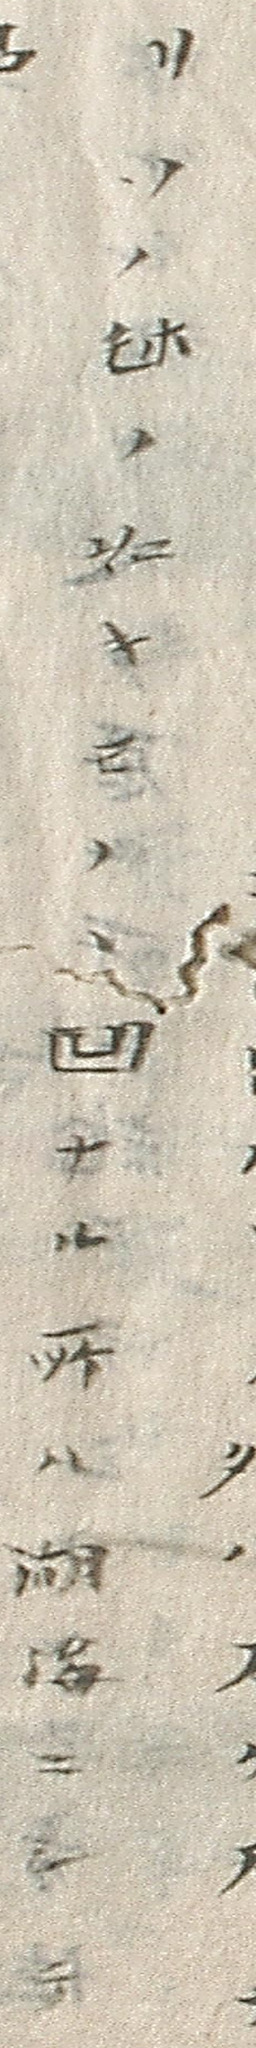リソノ毬ノ如キモノハ凹ナル所ハ湖沼ニシテ
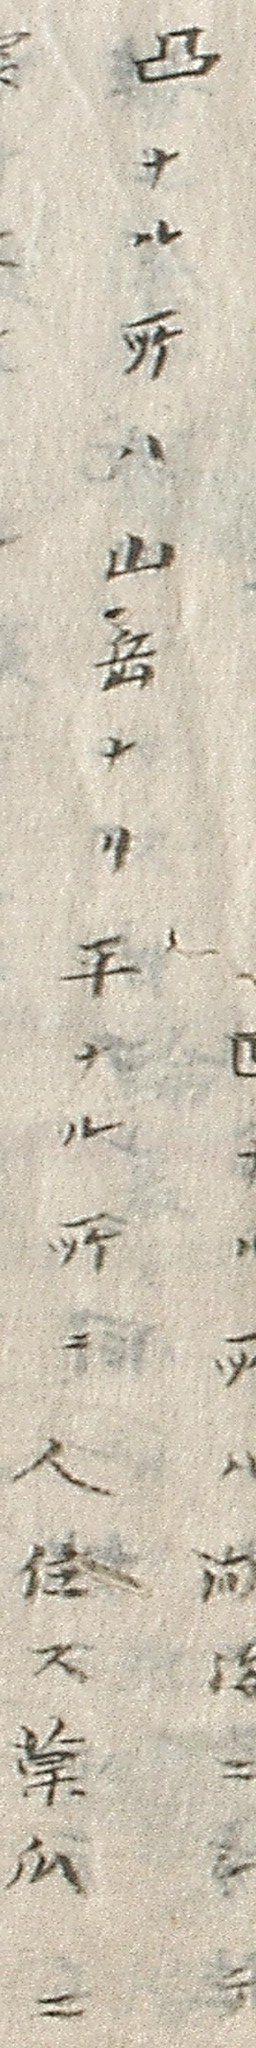凸ナル所ハ山岳ナリ平ナル所ニ人住ス菓瓜ニ
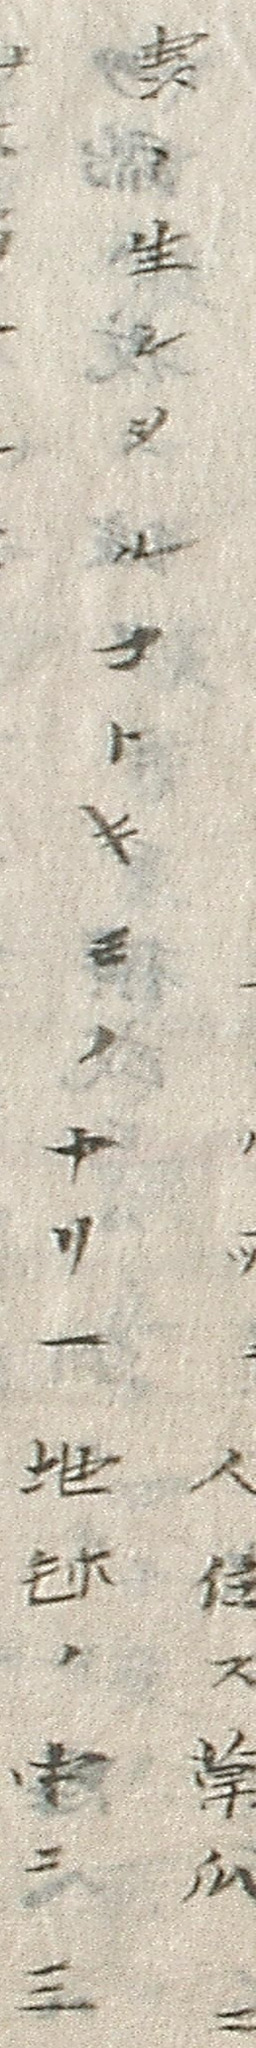蟲ノ生シタルコトキモノナリ一地毬ノ中ニ三
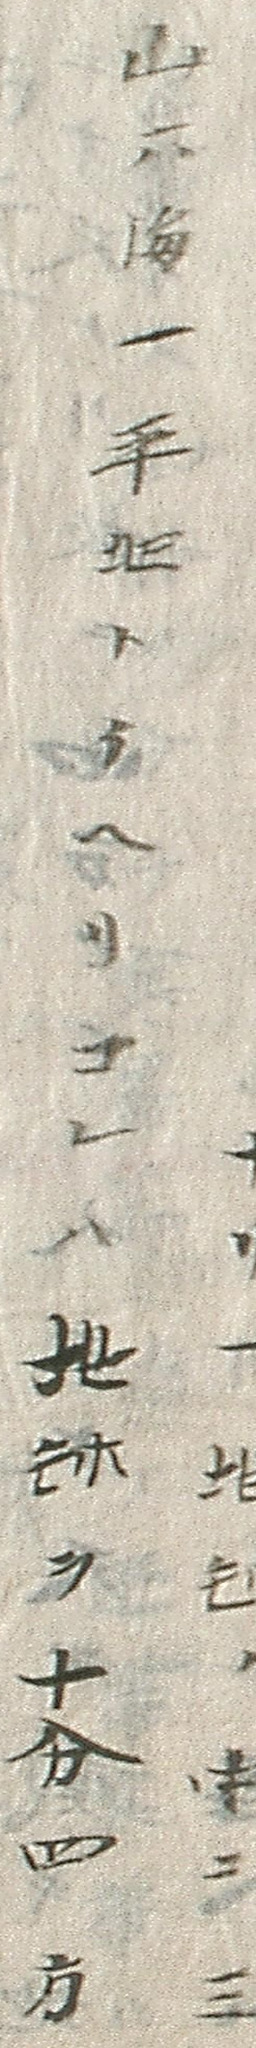山六海一平地トイヘリコレハ地毬ヲ十分四方
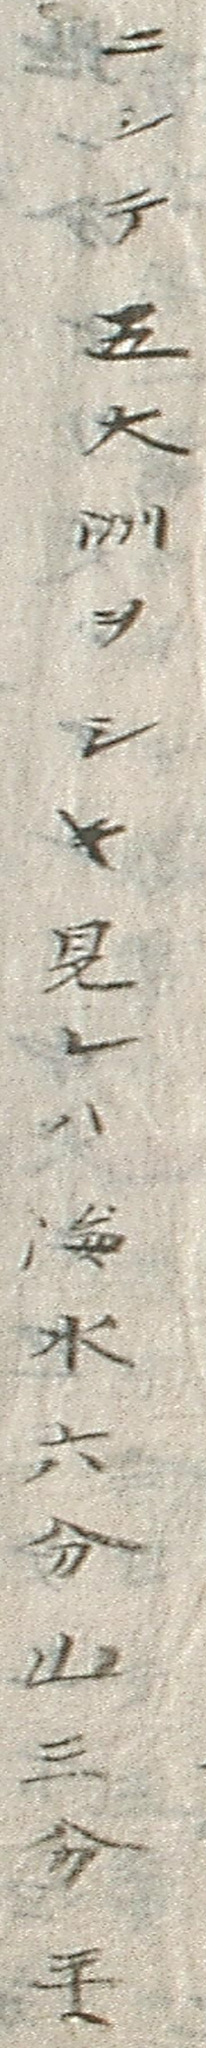ニシテ五大州ヲシテ見レハ海水六分山三分平

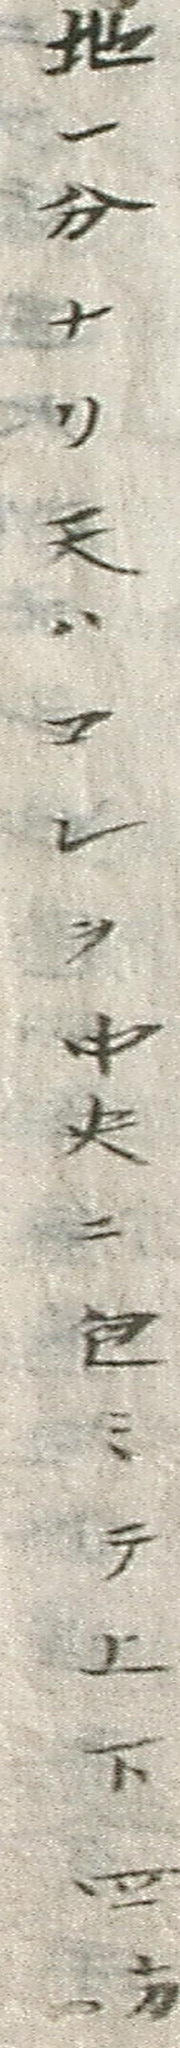地一分ナリ天ハコレヲ中央ニ包ミテ上下四方
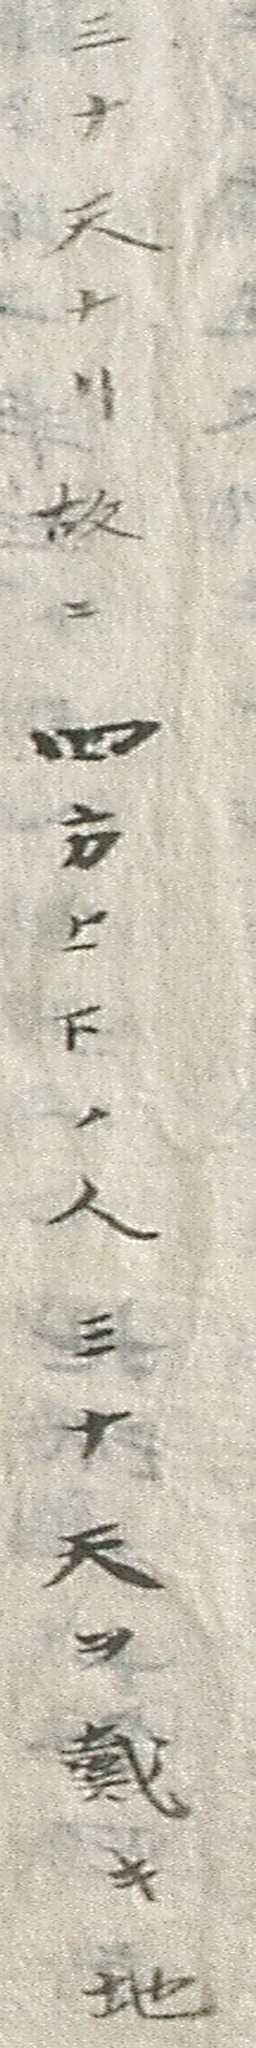ミナ天ナリ故ニ四方上下ノ人ミナ天ヲ戴キ地
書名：天學便蒙図説
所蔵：東京大学地震研究所図書室 Earthquake Research Institute Library, The University of Tokyo, JAPAN
